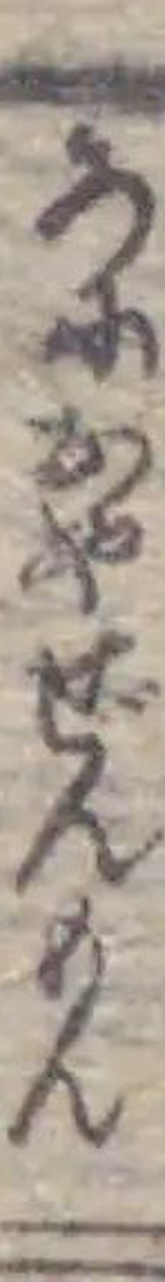ろにおやぜんもん
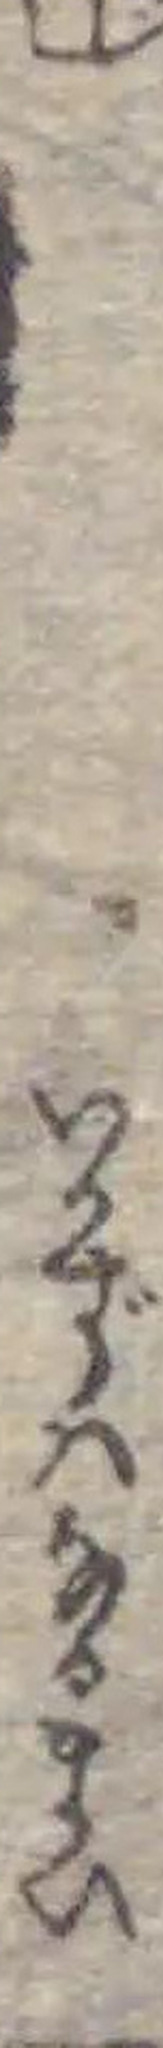いかずはなるまい
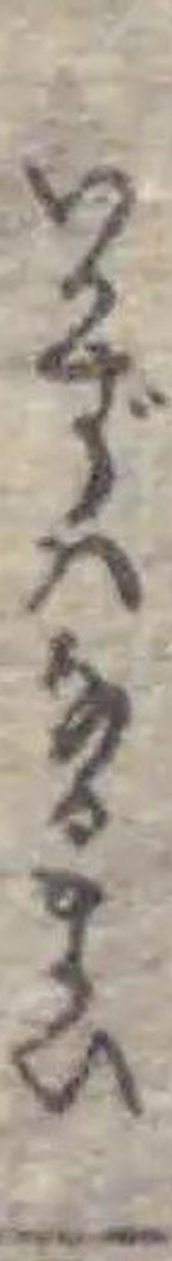いかずはなるまい
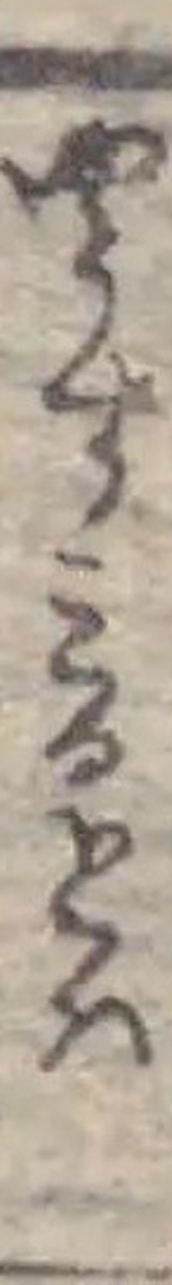やうすみるとは
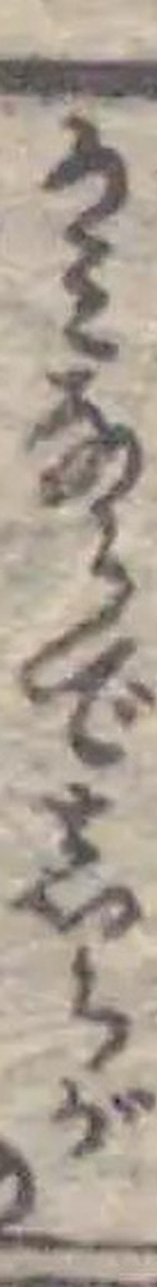かみならでしらがの
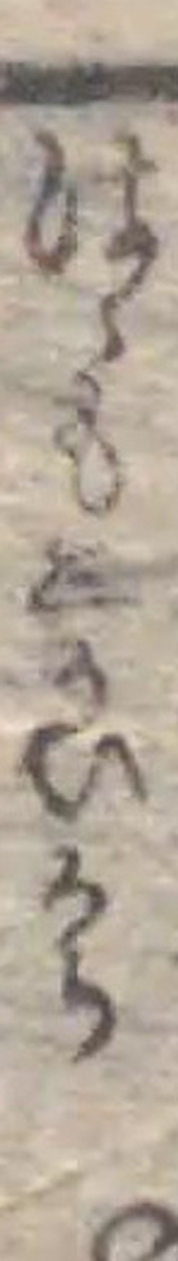はゝも二かいから
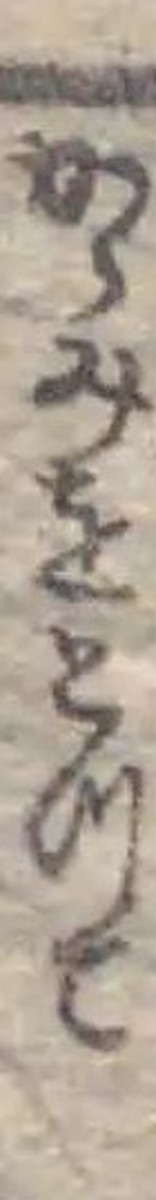かゝみをとつて
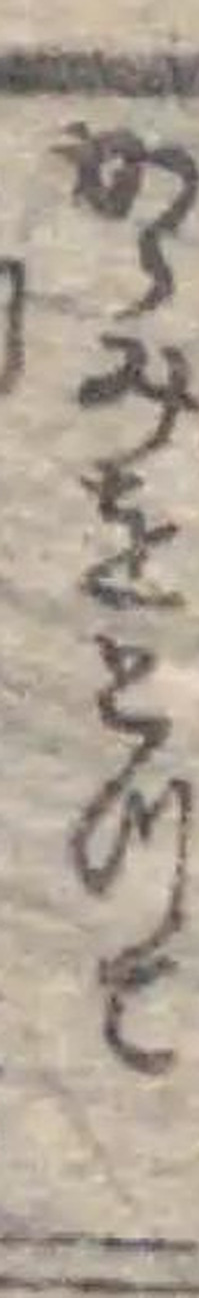かゝみをとつて
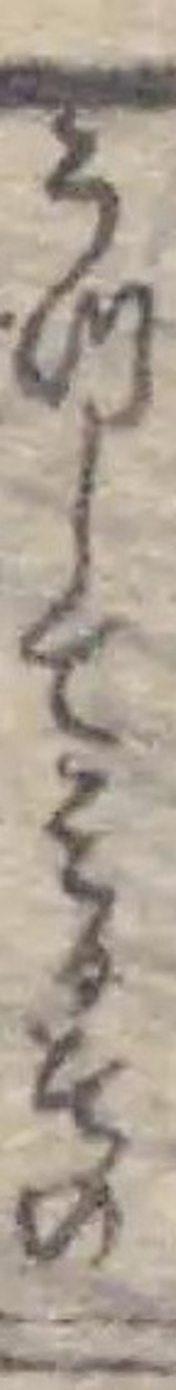うつしてみるその
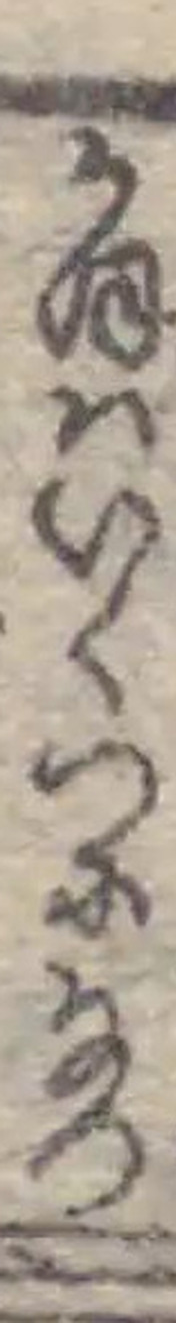かほはいくつになつ
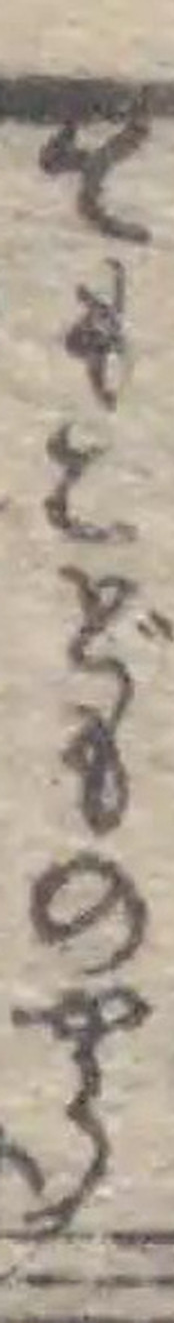てもこどものやうに
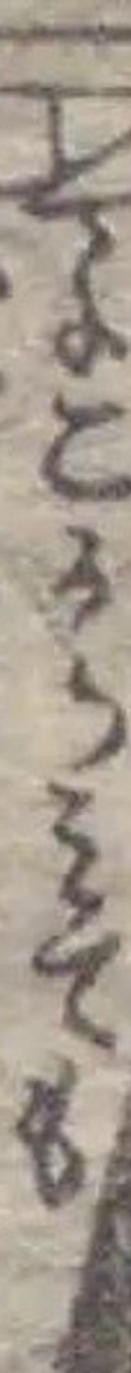〽よこからみても
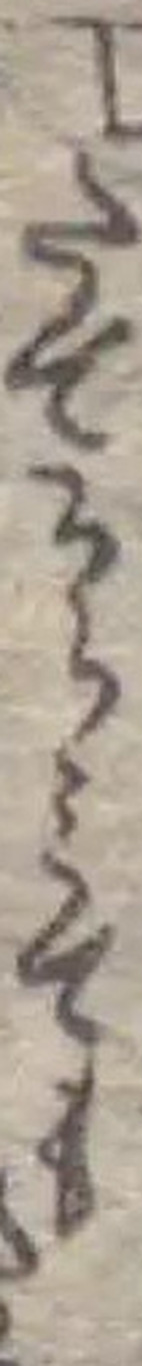たてからみても
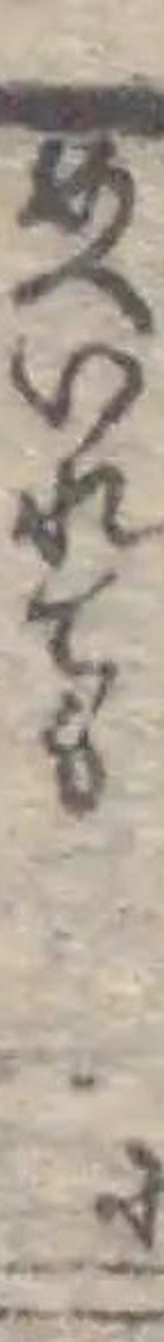めへいれても
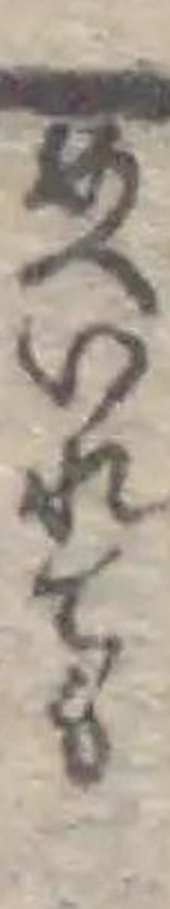めへいれても
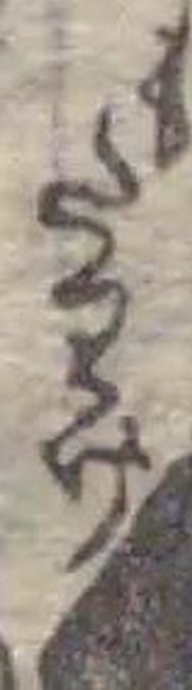たわけ
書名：福壽海旡量品玉 3巻
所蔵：国立国会図書館 National Diet Library, JAPAN
